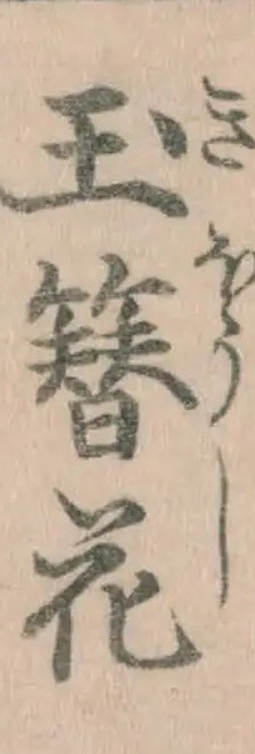玉簪花
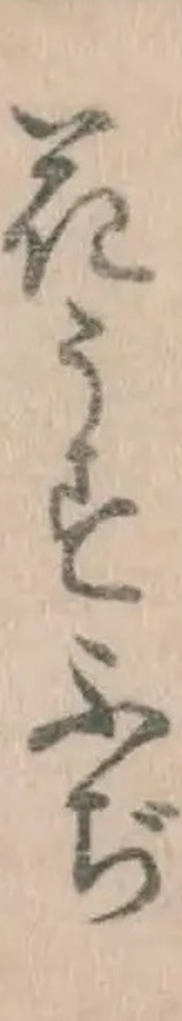花うすふぢ
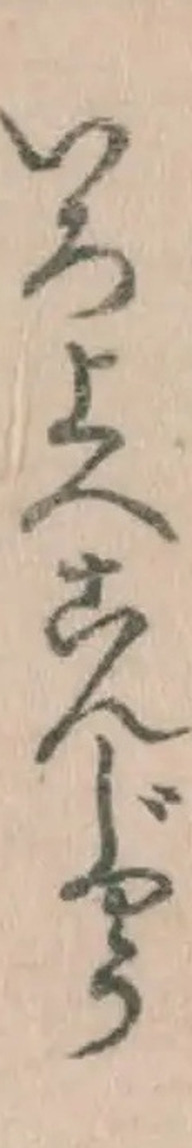いろ上へこんじやう
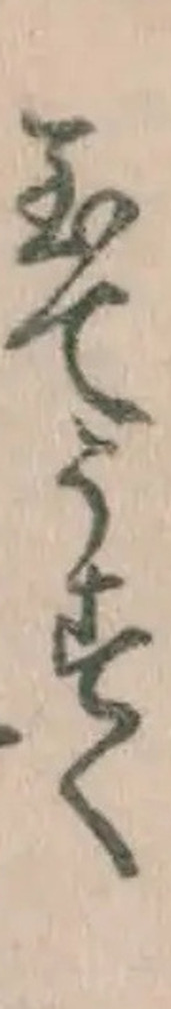至てうすく

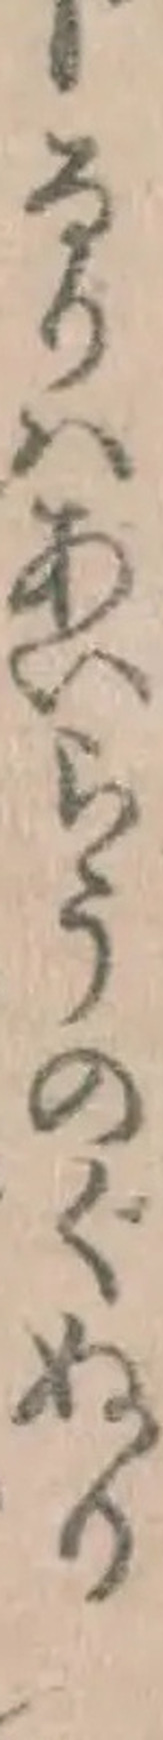蕣るりはあいらうのぐぬり
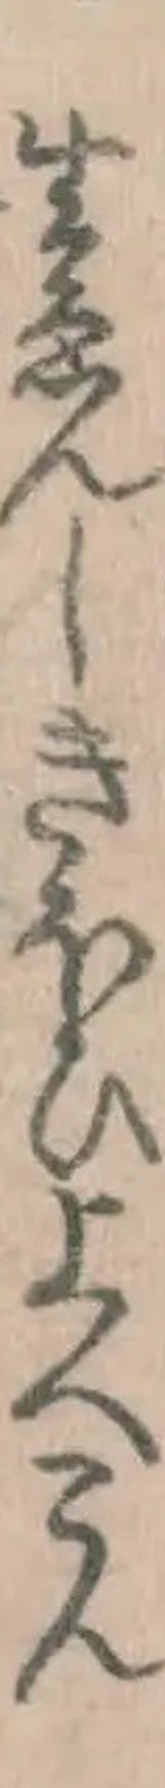生ゑんしきほひ上へこん
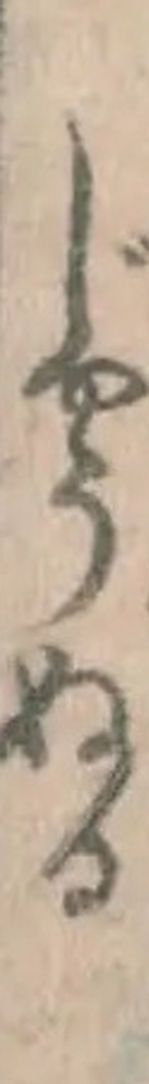じやうぬる
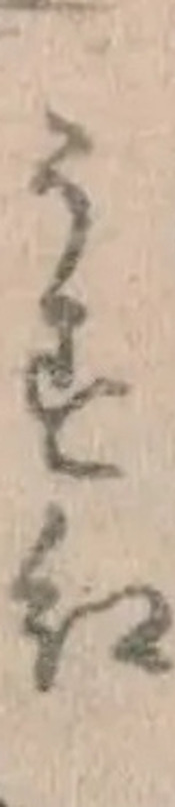うす紅
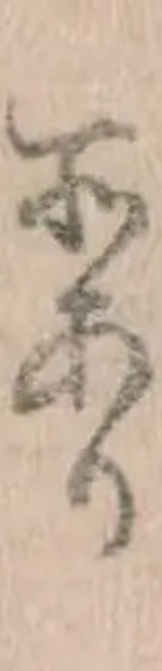所あり
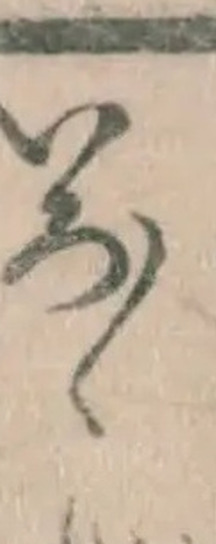いろ〳〵
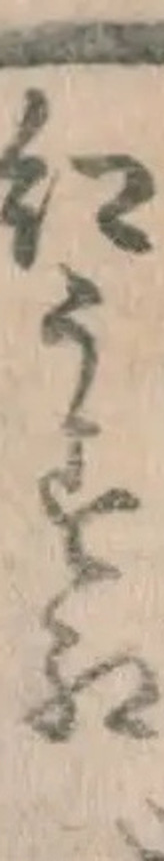紅うす紅
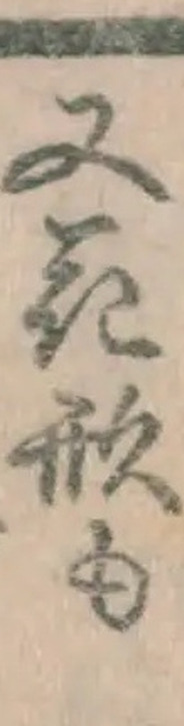又花形も
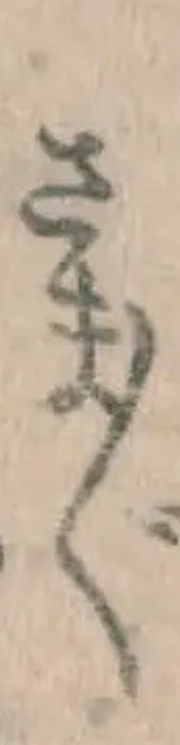さま〴〵

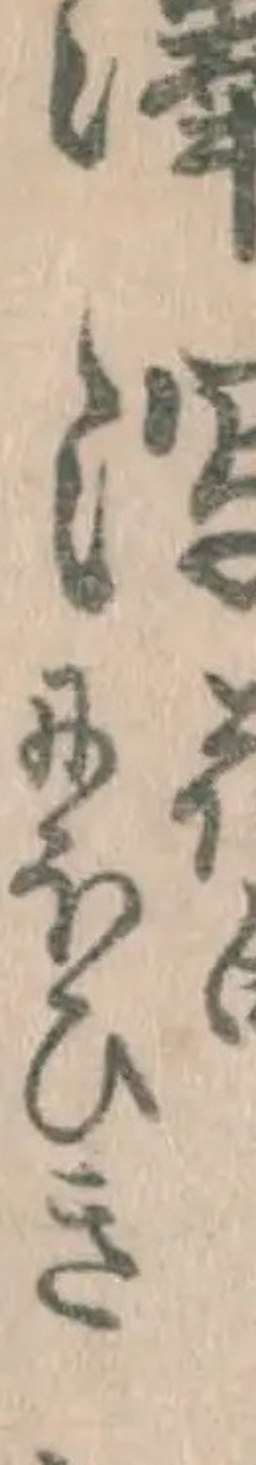にほひき
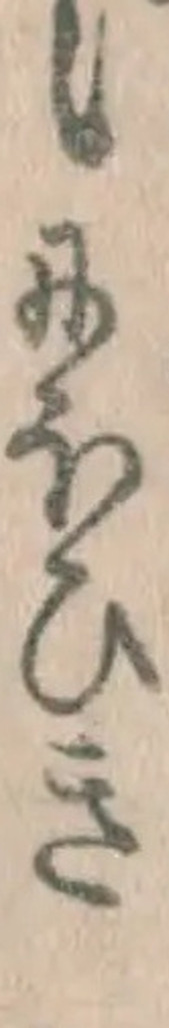にほひき
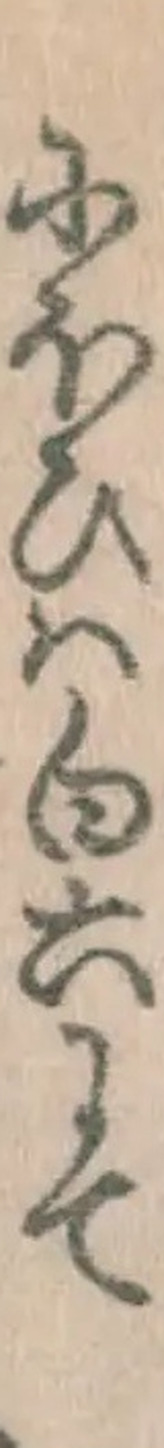にほひは白六にて
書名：絵本時津艸
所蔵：国立国会図書館 National Diet Library, JAPAN
